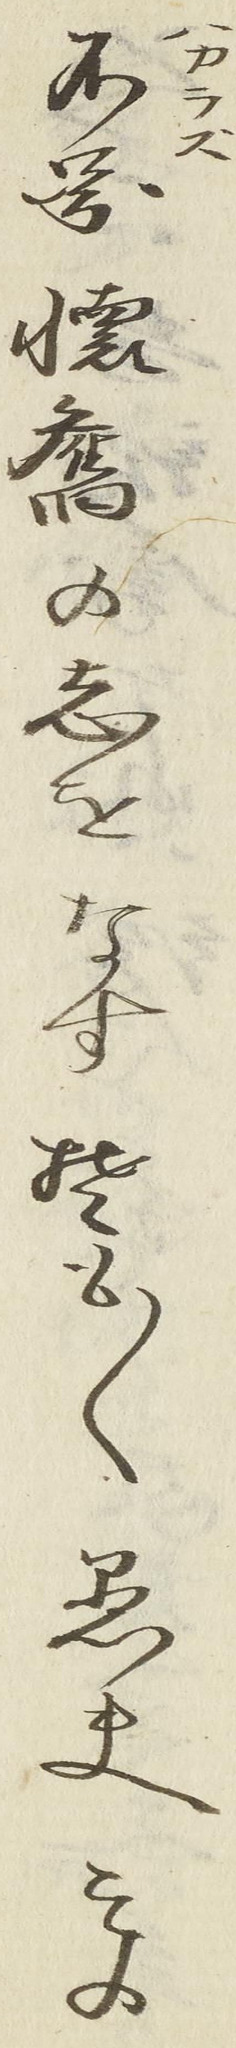不図懐旧の志をなすそも〳〵愚夫その
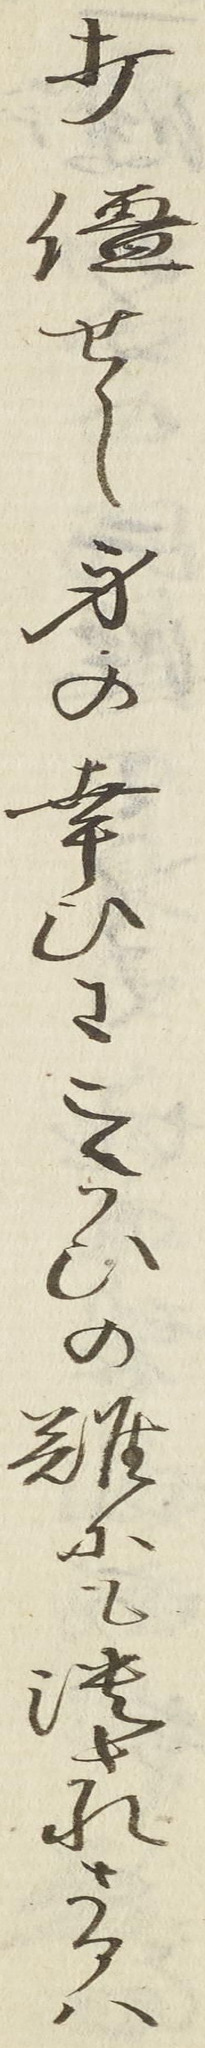打僵せし身の幸ひにこたひの難にも潰されさるは
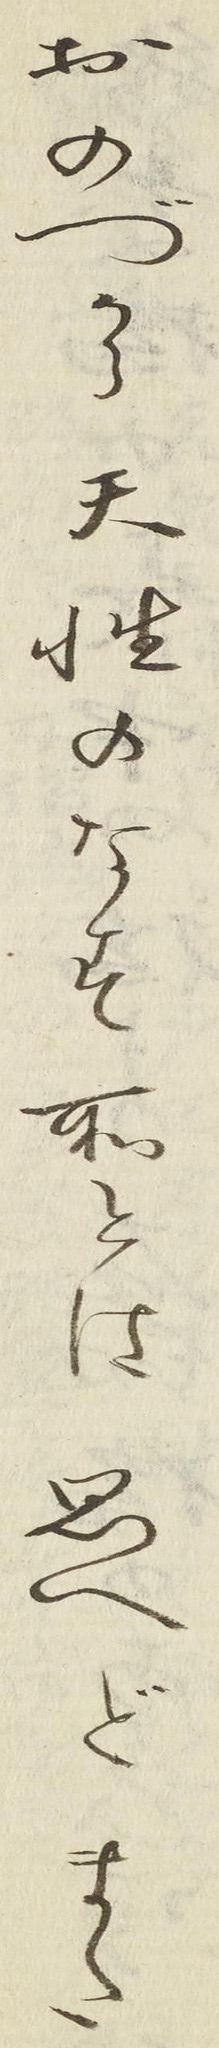おのづから天性のなす所とは思へどまた
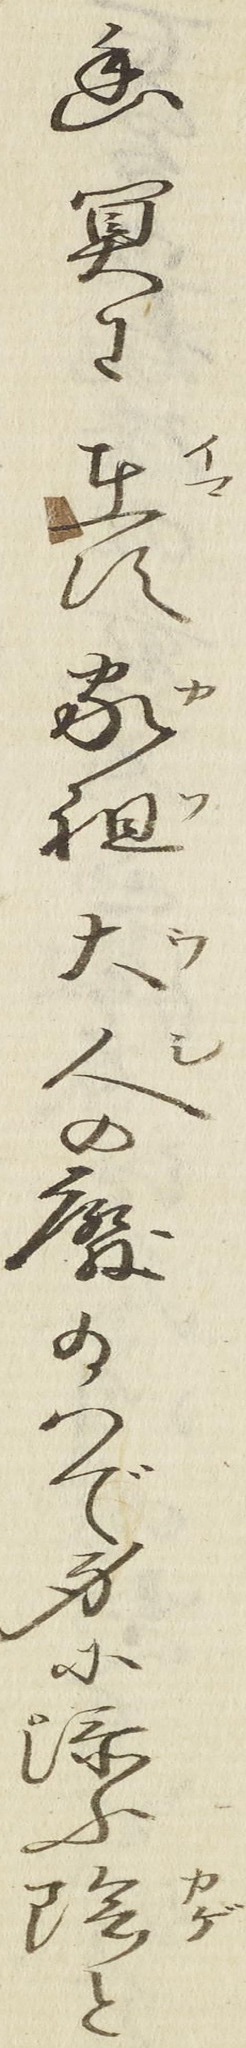幽冥に在す家祖大人の廃給はで身に添ふ陰と
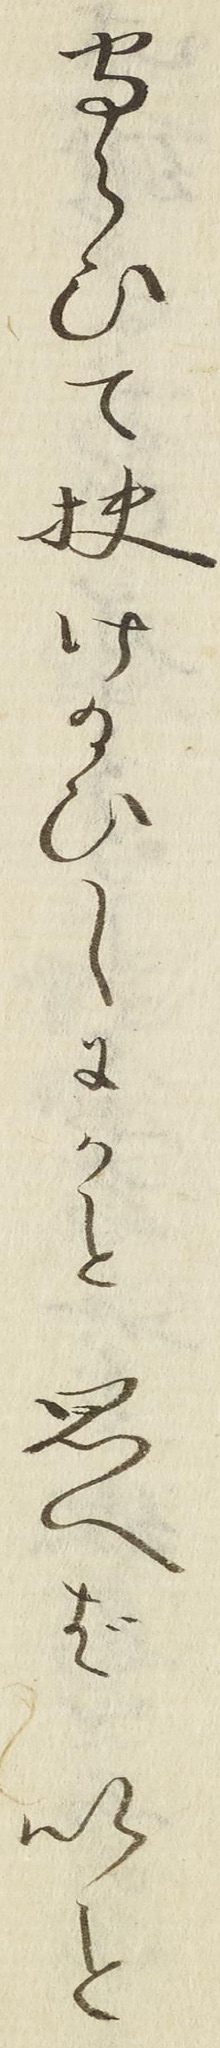守らひて扶け給ひしにかと思へばいと
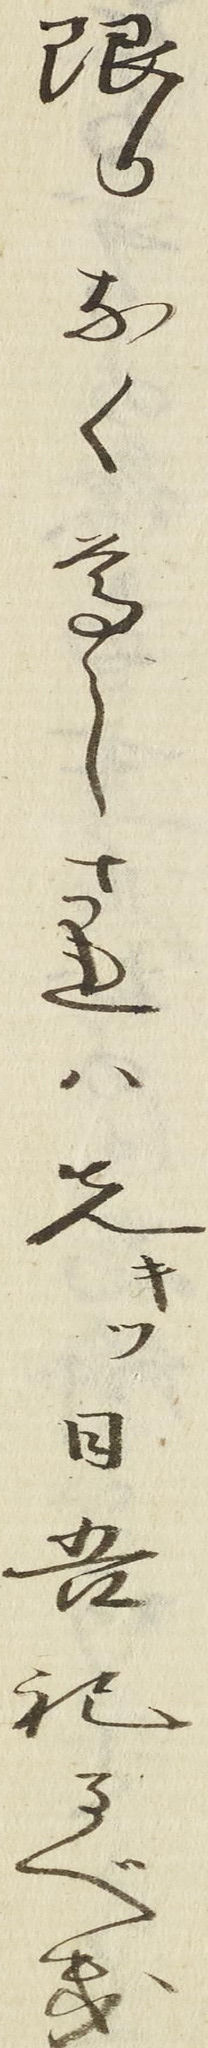限りなく尊しされは先日吾祀るべき
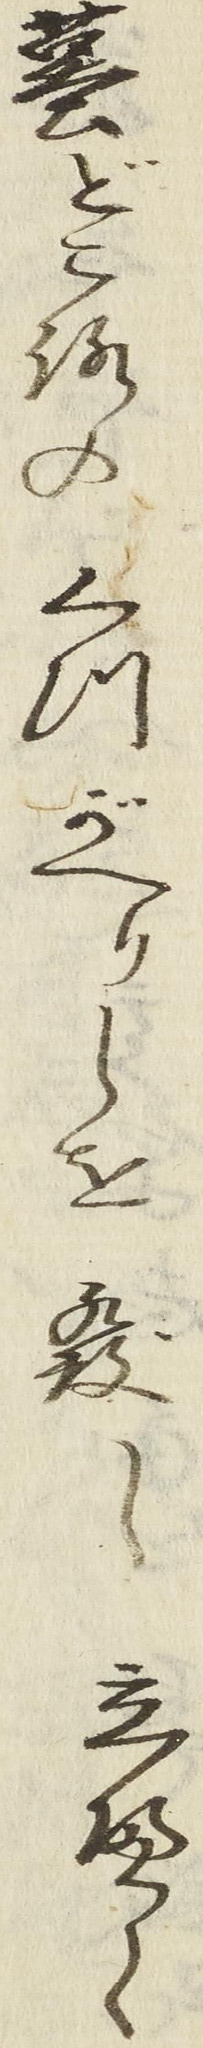墓どころのくつがへりしを発し立へく
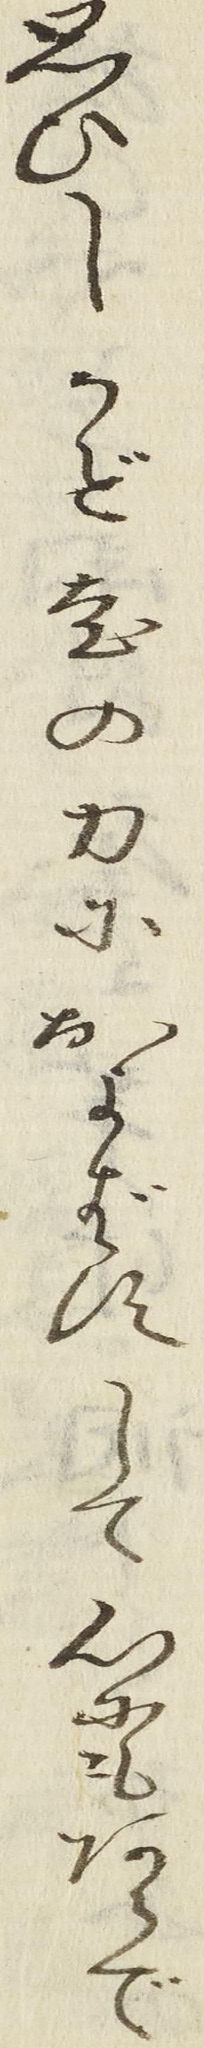思ひしかど老の力におよばすして心にもあらで
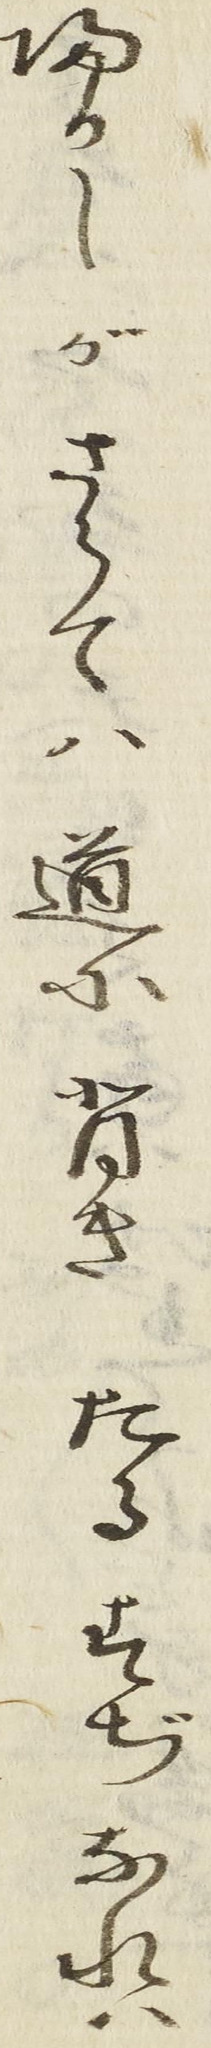帰りしがさらては道に背きたるすぢなれは
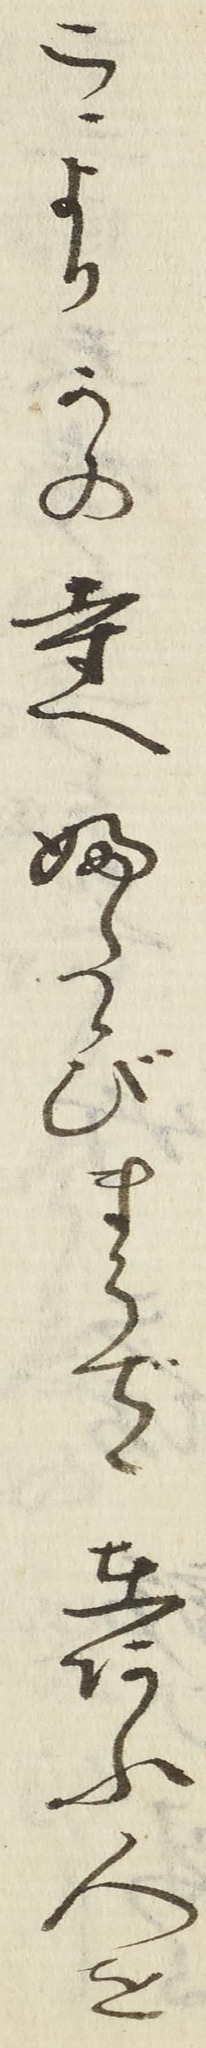こゝよりかの寺へふたゝびまうでゝ在あふ人を
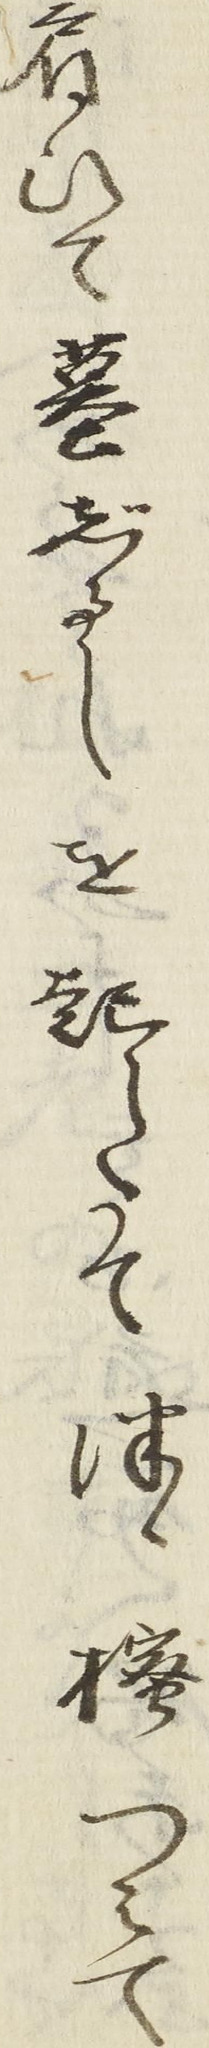雇ひて墓じるしを起し立てつゝ櫁つみて
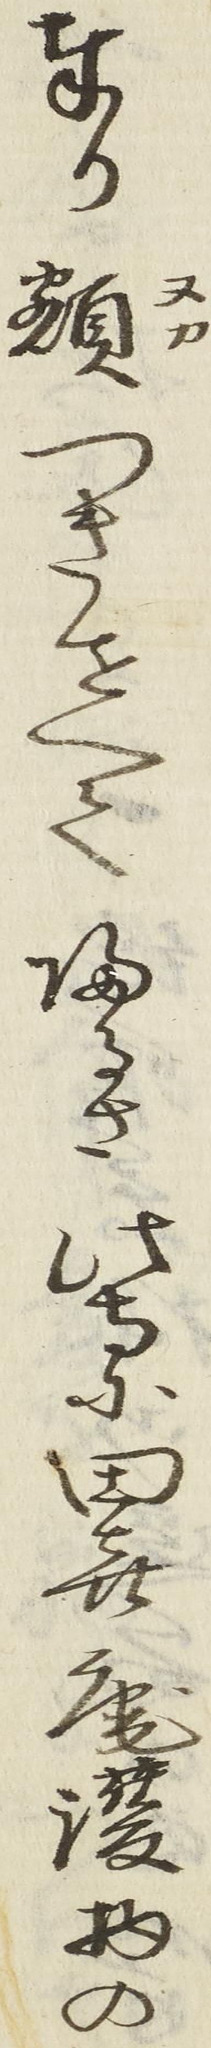奉り額つきをへて帰るさ此寺に田喜庵護物の
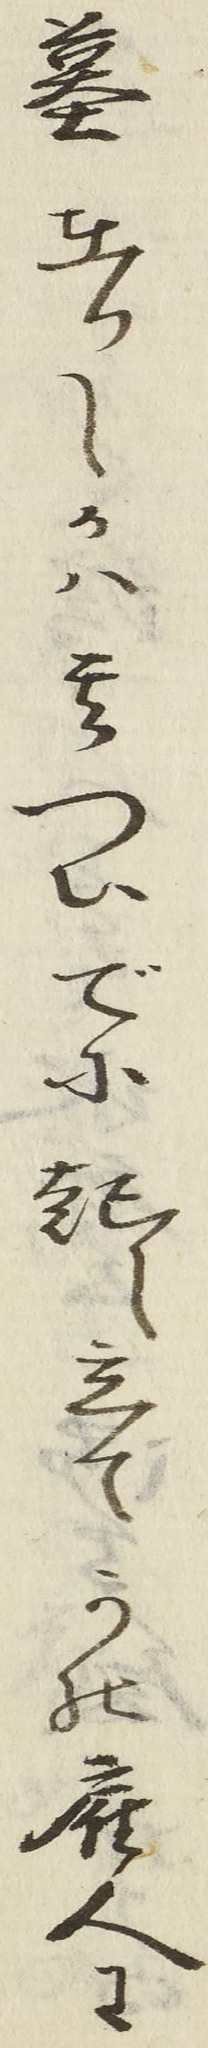墓在りしかは其ついでに起し立てかの雇人に
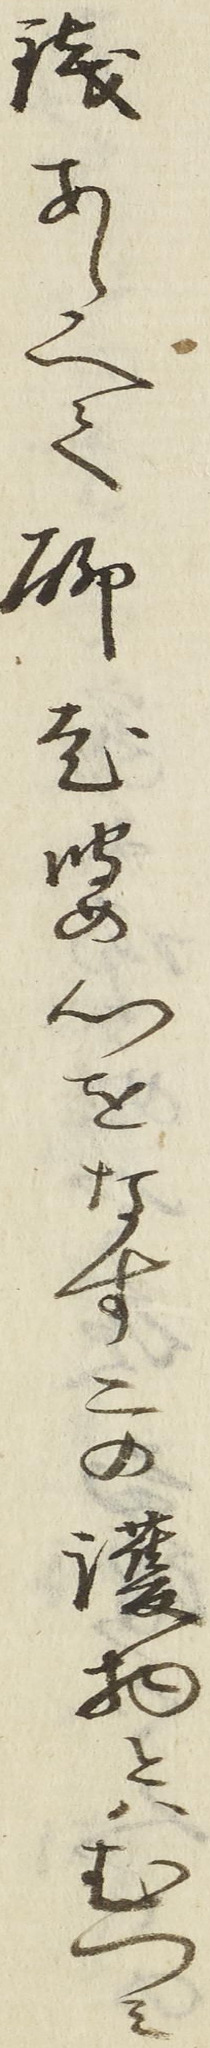銭あたへて聊老婆心をなすこの護物とはむつみ
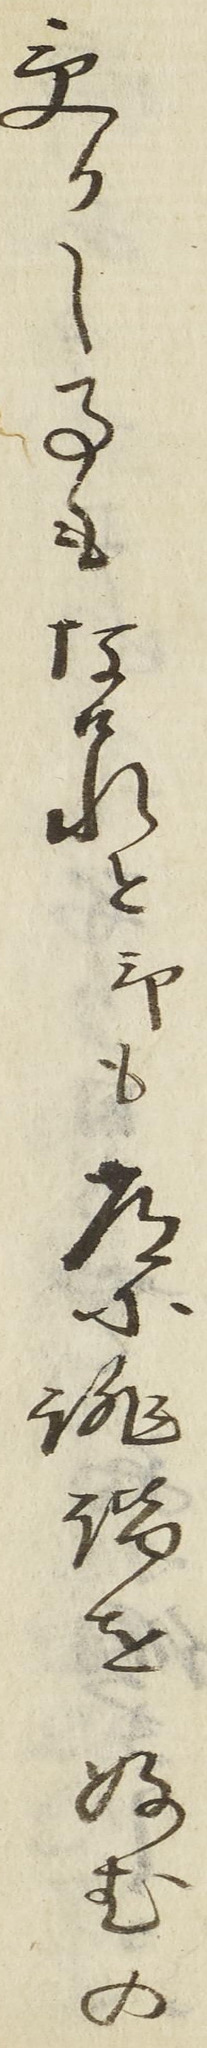受りし事もなけれと予も常に誹諧を好むの

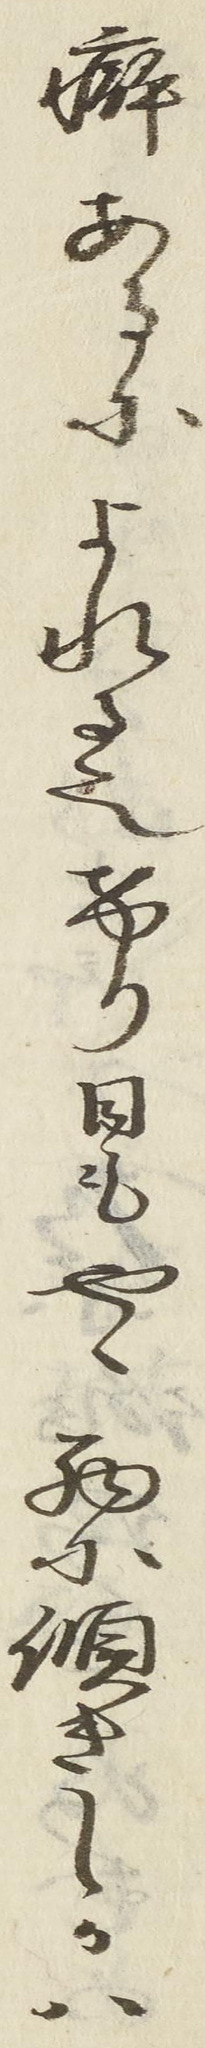癖あるによれる也けり日もやゝ西に傾きしかは
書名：やぶれ窓の記　全
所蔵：東京大学地震研究所図書室 Earthquake Research Institute Library, The University of Tokyo, JAPAN
